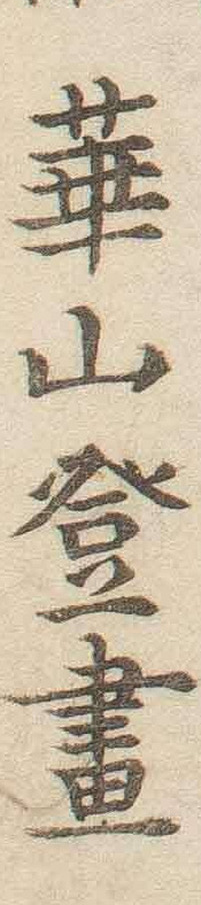華山登畫

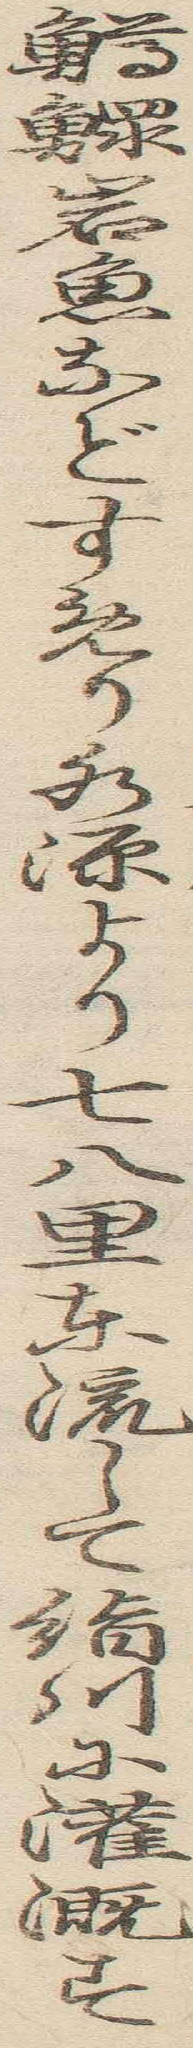鱒鰥岩魚などすめり水源より七八里東流して絹川に灌漑す
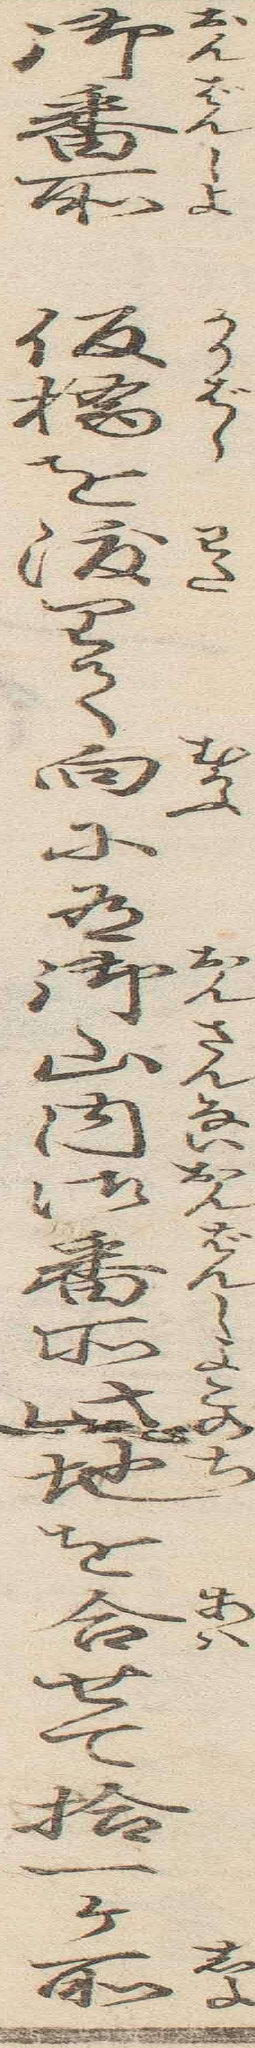御番所仮橋を渡りて向に有御山内御番所此地を合せて拾一ヶ所
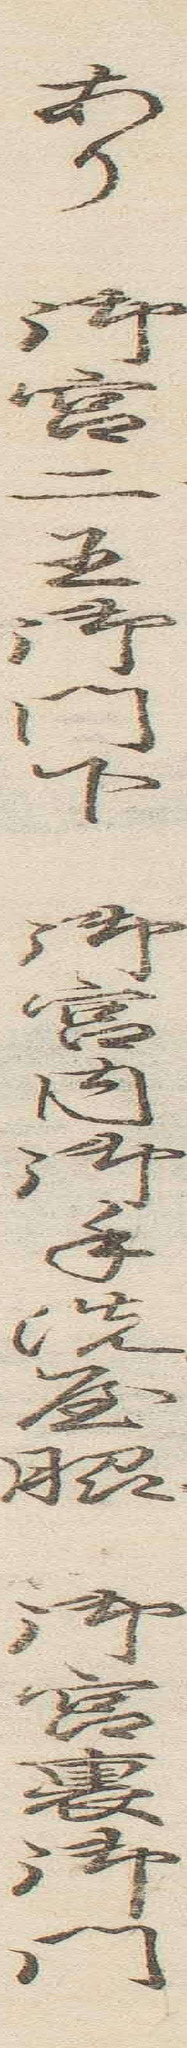あり御宮二王御門下御宮内御手洗屋脇御宮裏御門
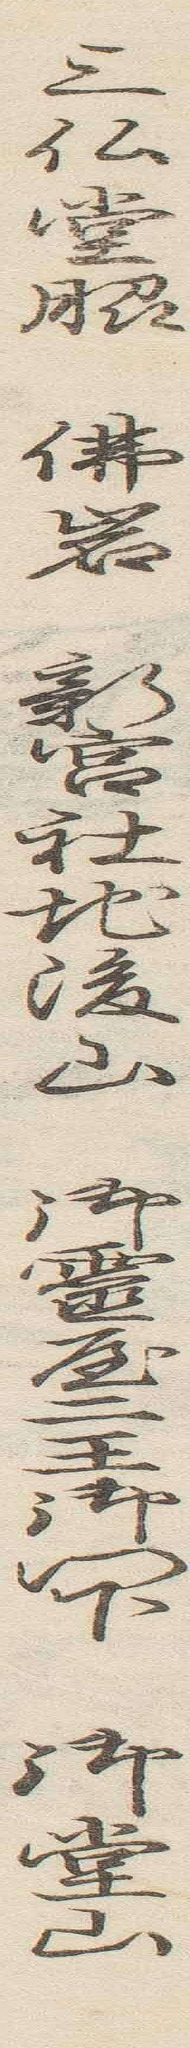三仏堂脇佛岩新宮社地後山御靈屋二王御門下御堂山
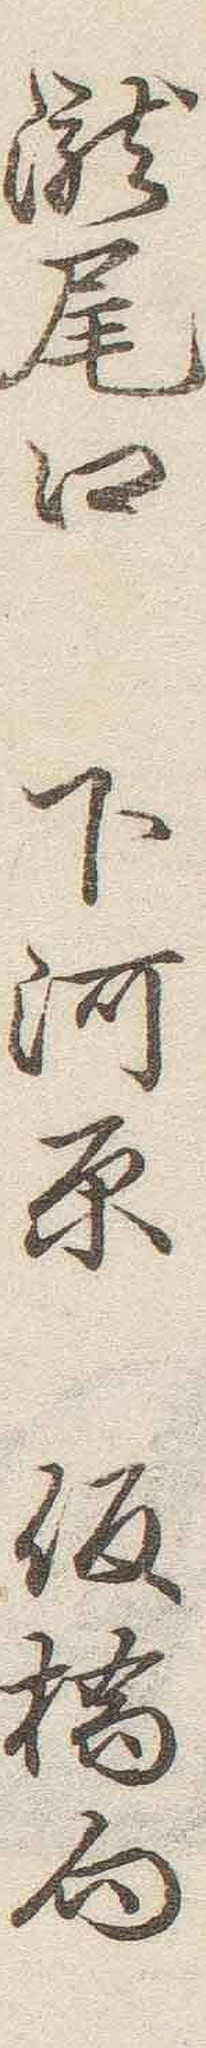瀧尾口下河原仮橋向
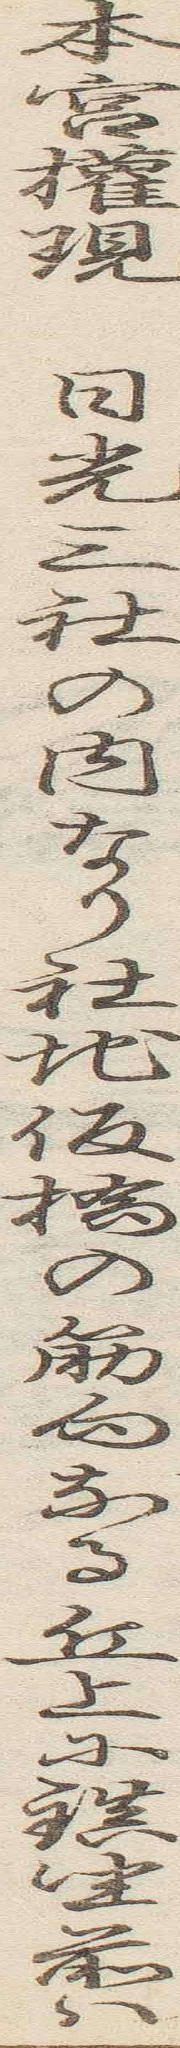本宮權現日光三社の内なり社地仮橋の筋向なる丘上に鎭坐前は
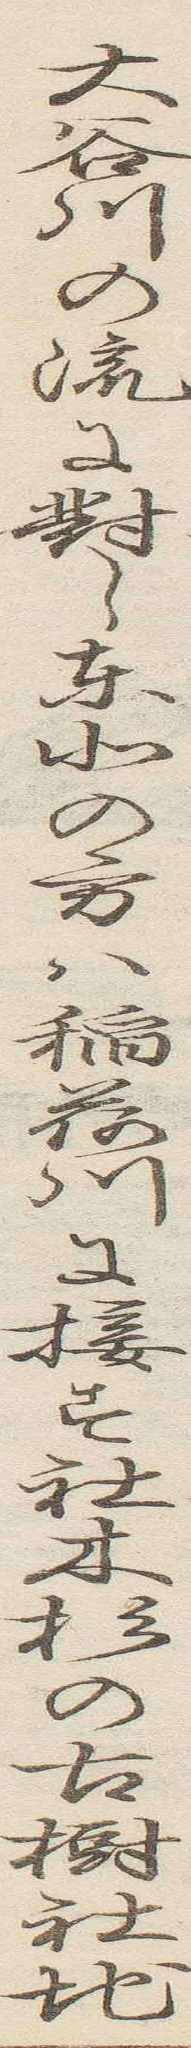大谷川の流に對し東北の方は稲荷川に接す社木杉の古樹社地
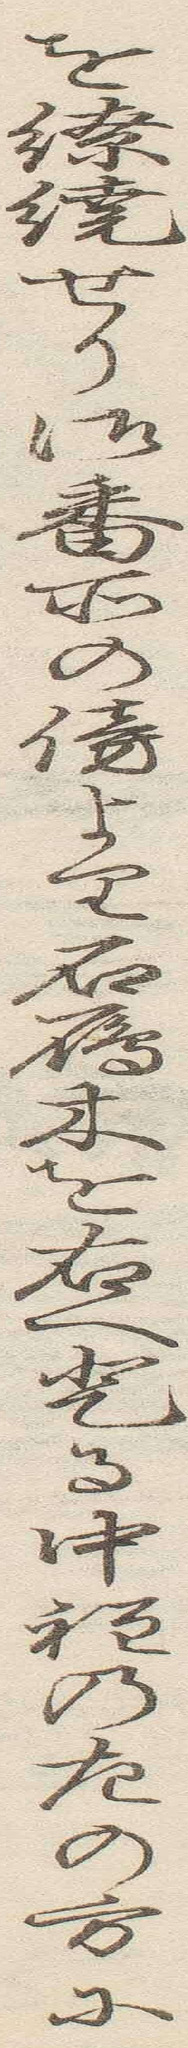を繚繞せり御番所の傍より石鴈木を右へ登る中程の左の方に
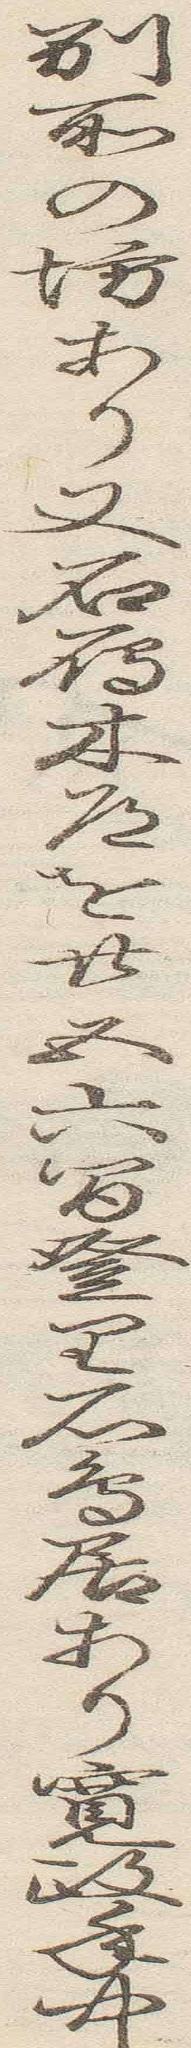別所の坊あり又石鴈木道を廿五六間登り石鳥居あり寛政年中
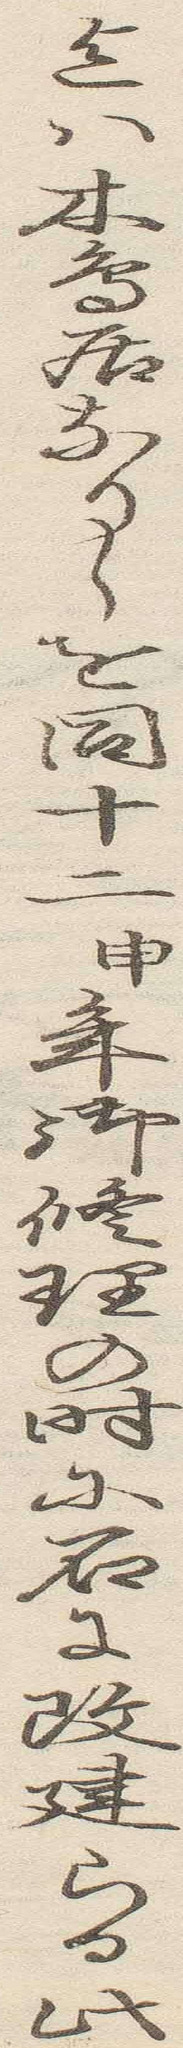迠は木鳥居なりしを同十二申年御修理の时に石に改建らる此
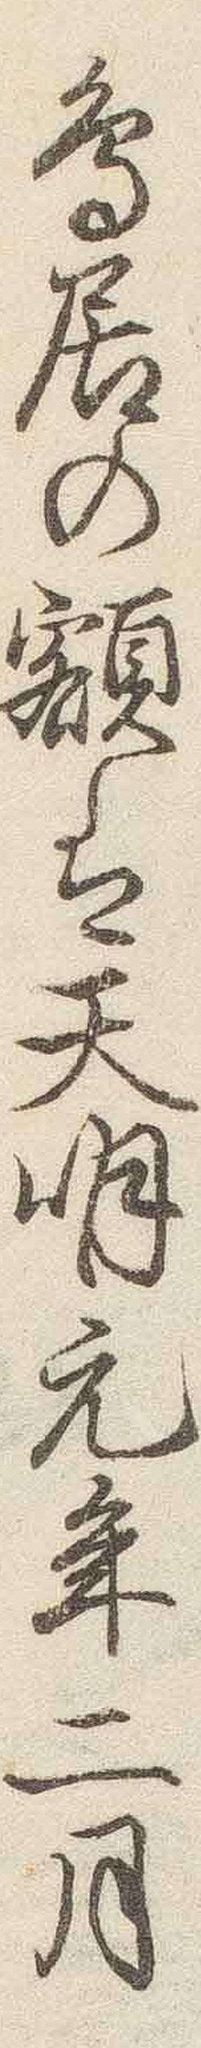鳥居の額は天明元年二月
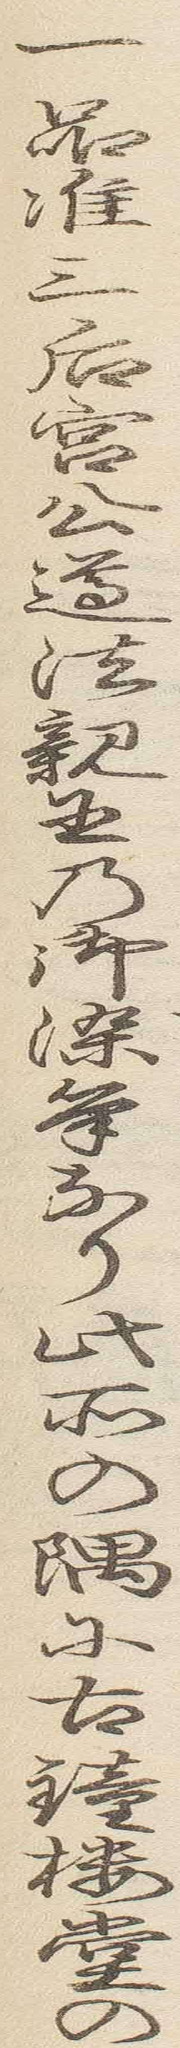一品准三后宮公道法親王の御染筆なり此所の隅に古鐘楼堂の
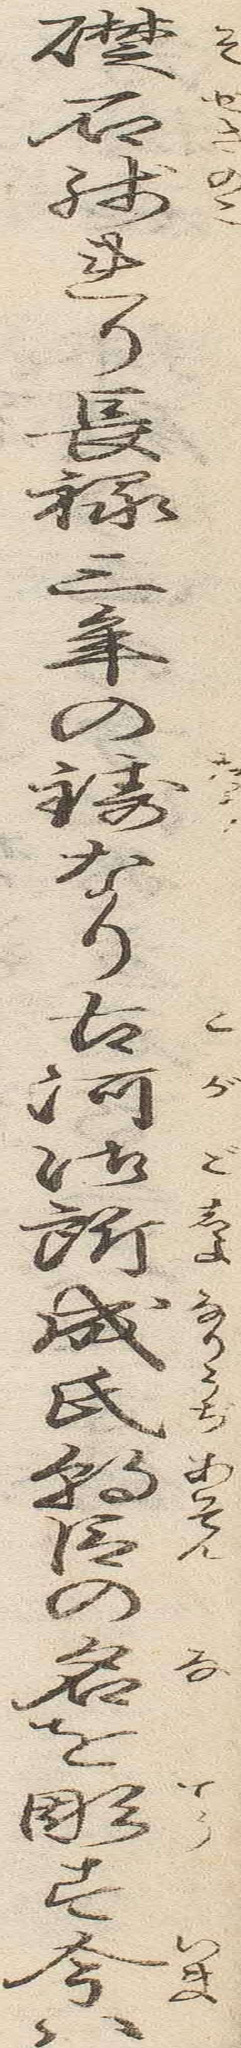礎石残れり長禄三年の鋳なり古河御所成氏朝臣の名を彫す今は
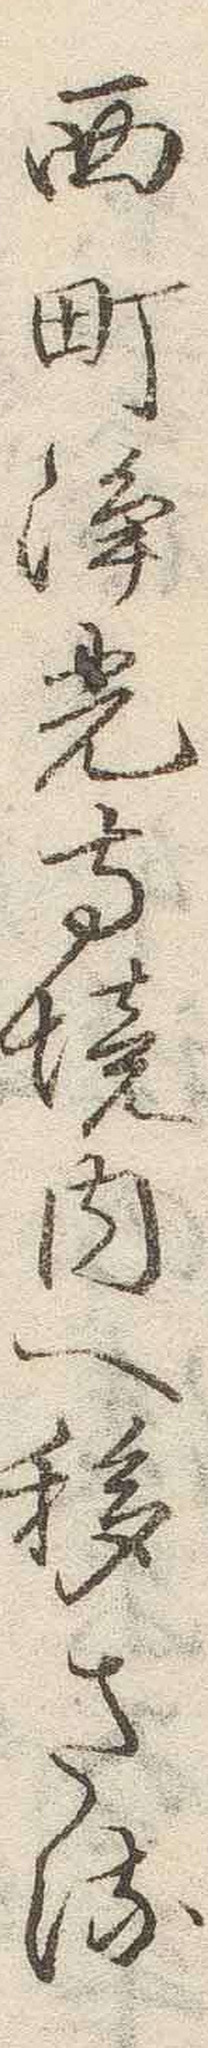西町浄光寺境内へ移さる
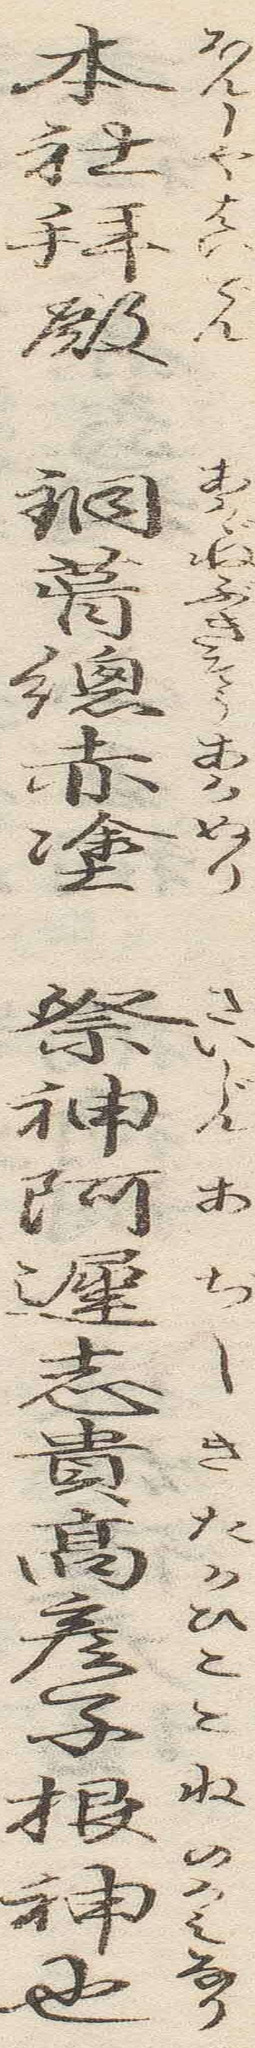本社拜殿銅葺總赤塗祭神阿遲志貴高彦子根神也
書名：日光山志
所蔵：東京学芸大学附属図書館 国文学研究資料館
